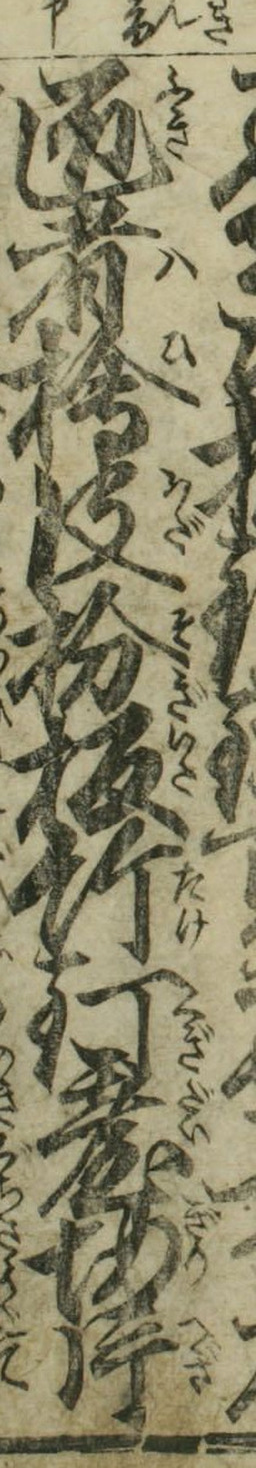匠者檜皮枌板竹釘台切片
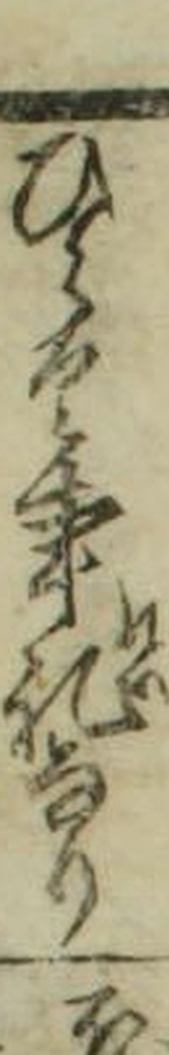ひらく事礼なり
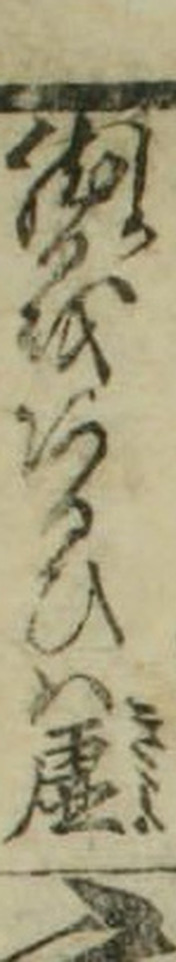然るをあるひは虚

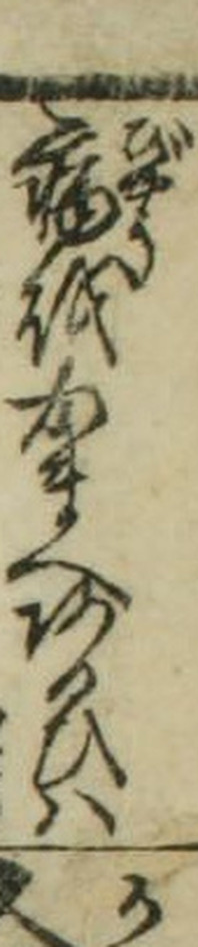病をかまへあるひは
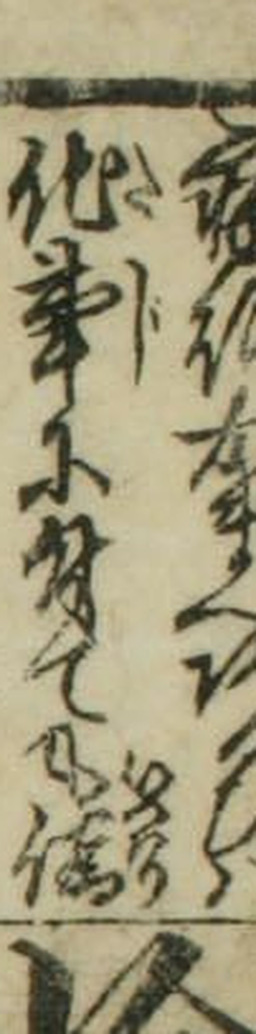他事に付ても偽
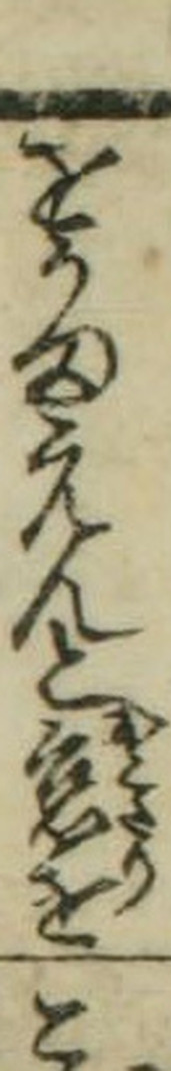をかまえんと怠を
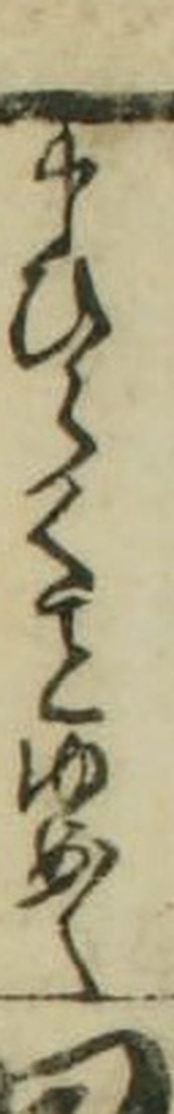申ひらくことゆめ〳〵
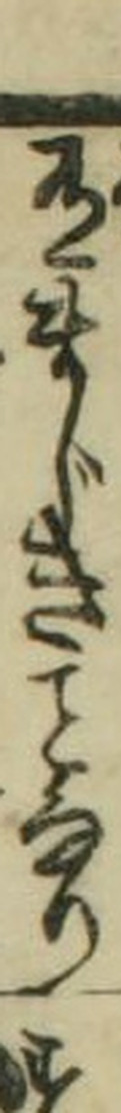有まじきことなり
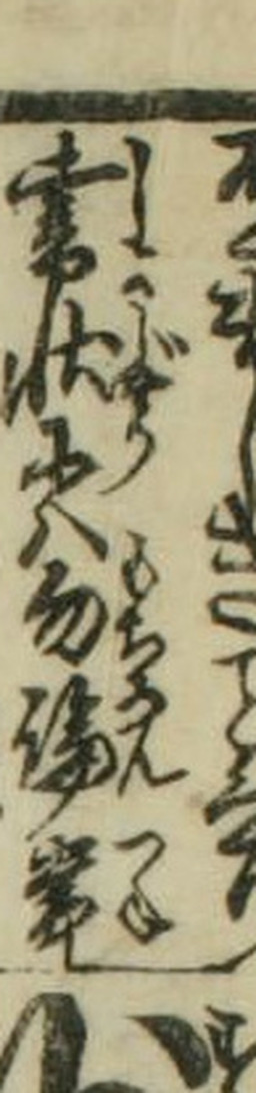書状には勿論常
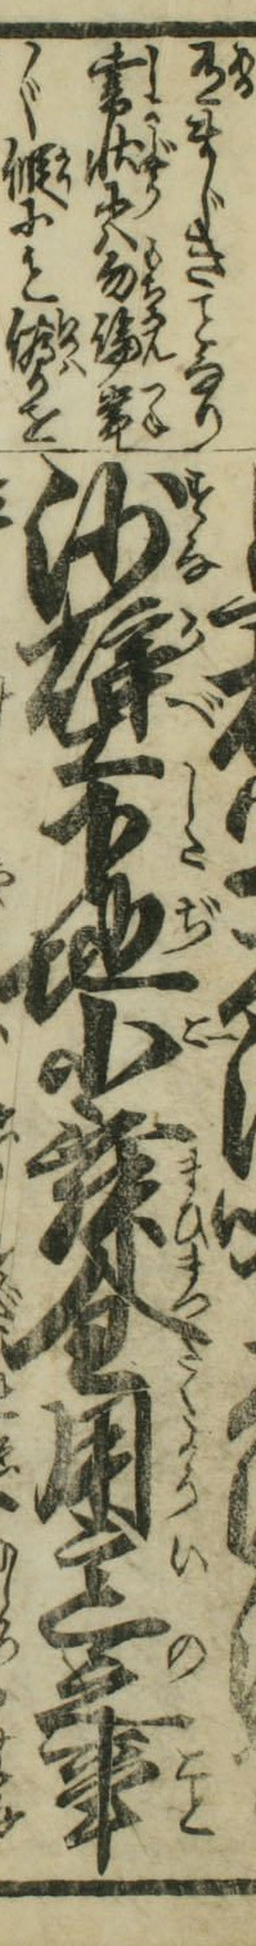沙壁下地小舞全用意之事
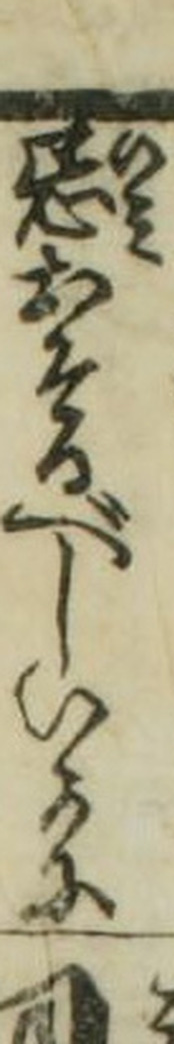忌おそるべしいかに
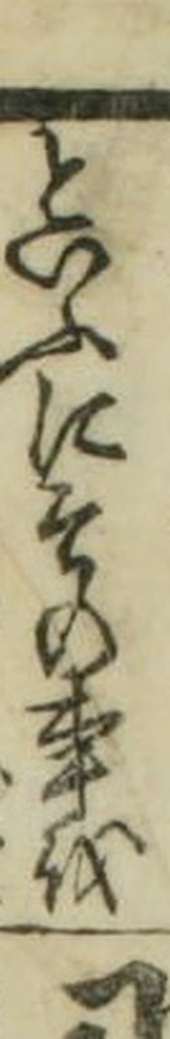といふにその事を
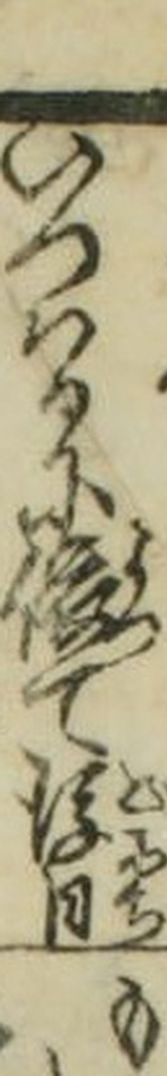いつはるに依て後日
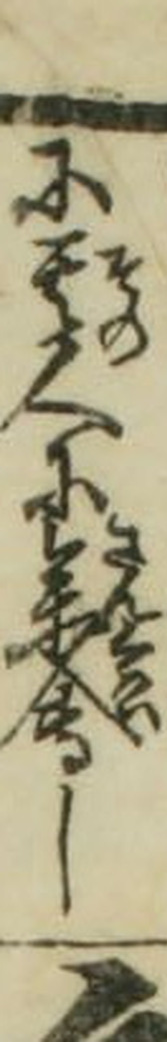に其人に参会し
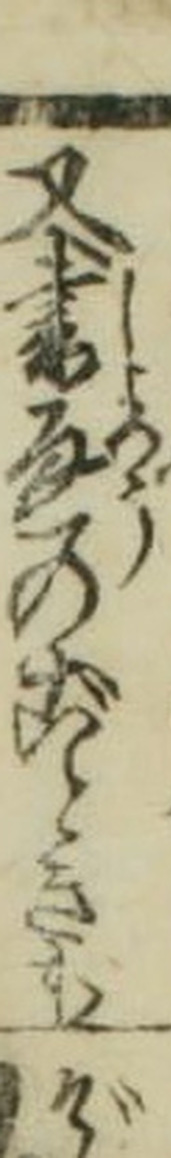又書通のごときも
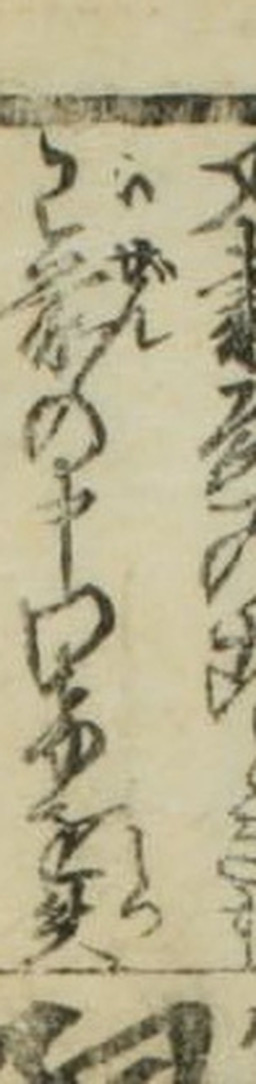已然の申わけを失
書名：増補職人往来
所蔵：東京学芸大学教育コンテンツアーカイブ
